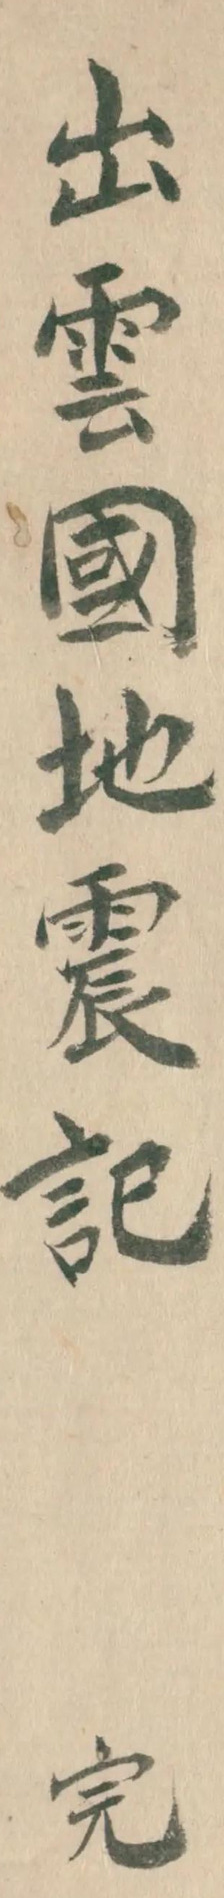出雲国地震記完
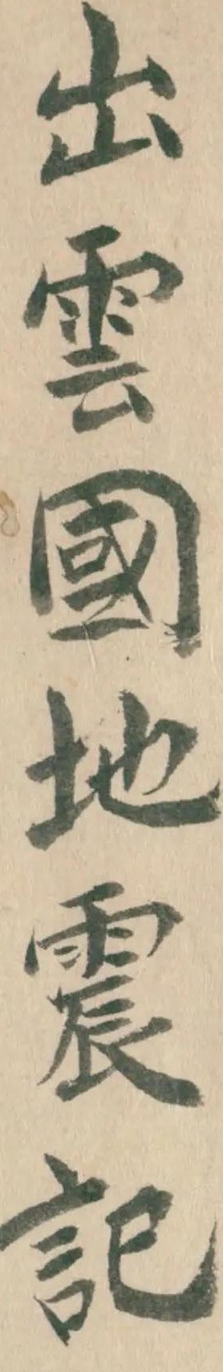出雲国地震記完

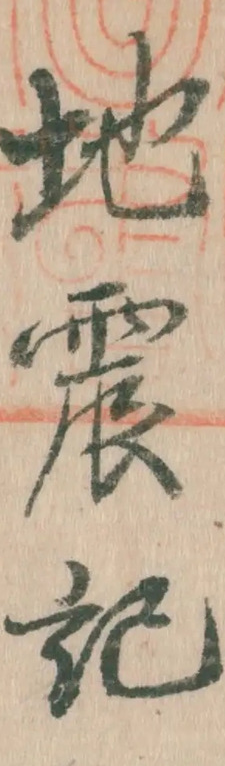地震記

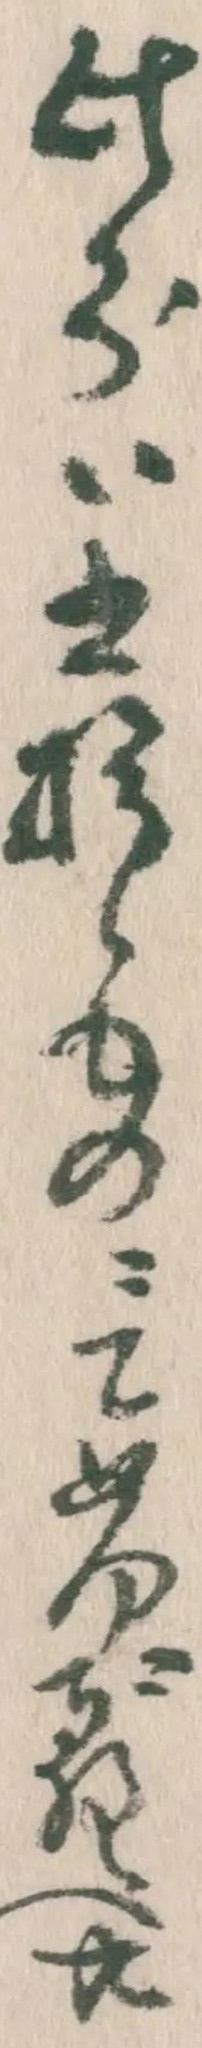此分は書捨候ものにて如何に奉存候へ共
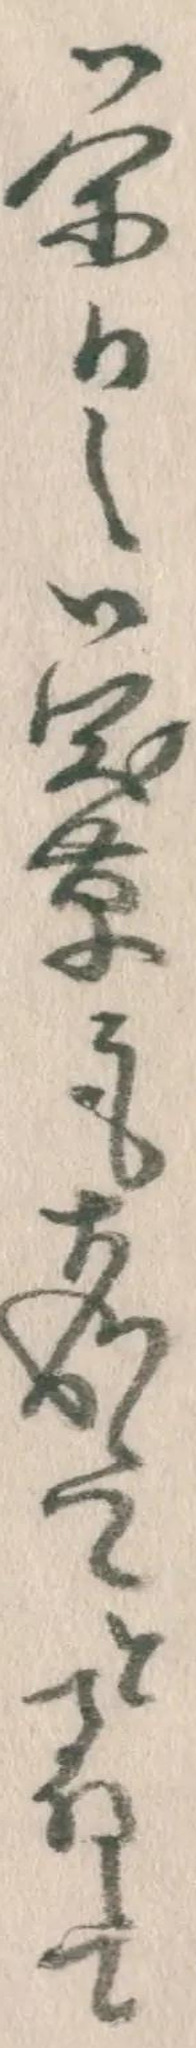御閑日之御笑草にも相成候はゝと奉存候て
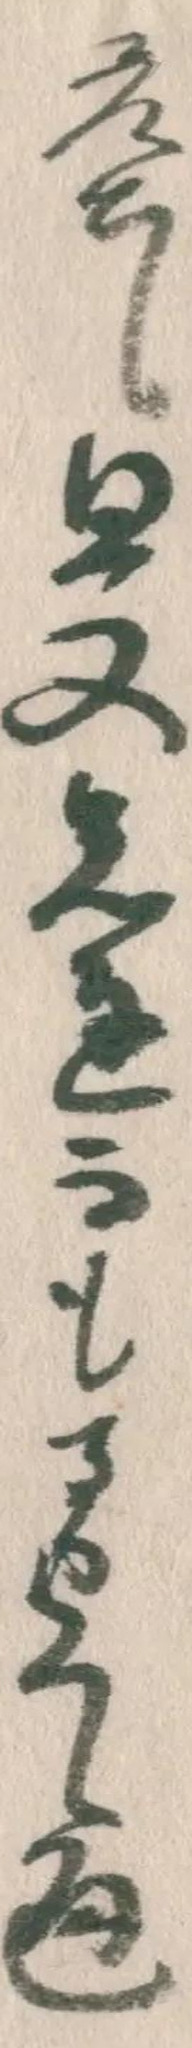差出候且又先達而も奉申上候通
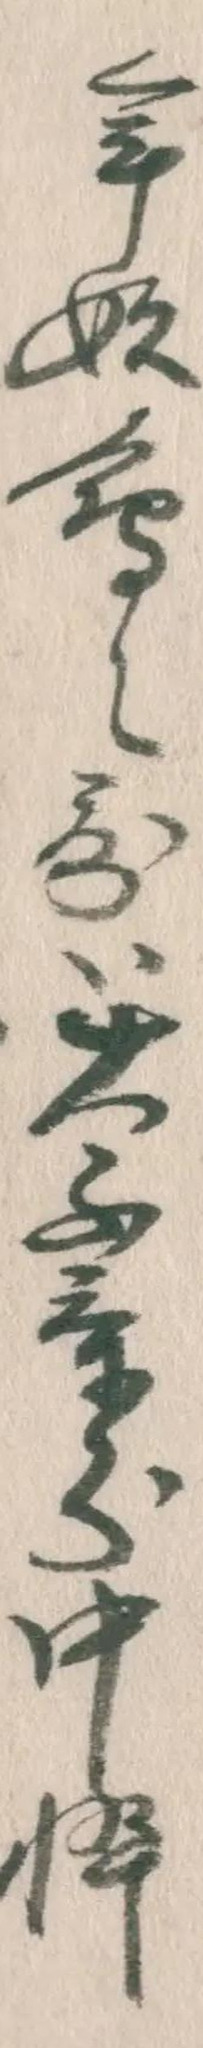年始会之度は大不気分中倅
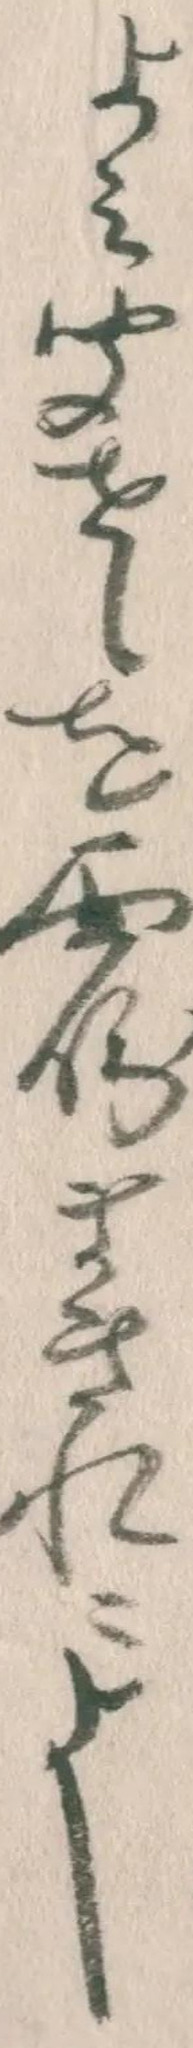よみ聞せ候を面倒まきれによし
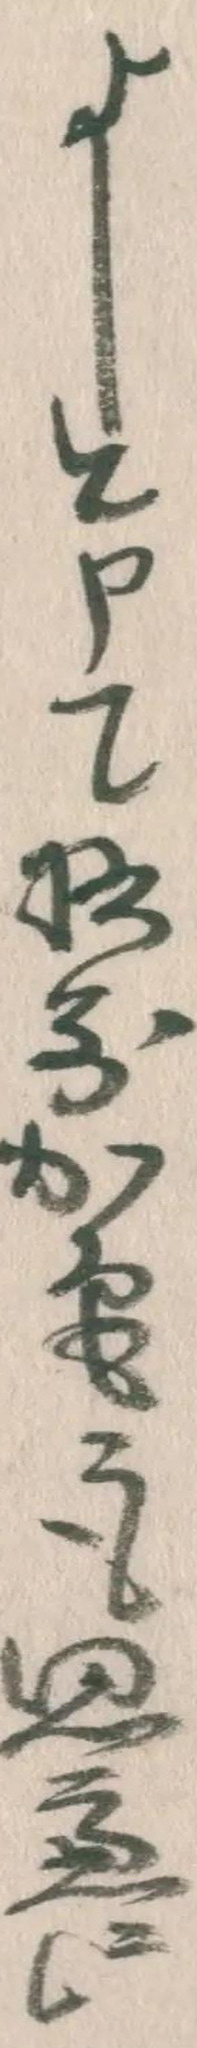よしと申て格別加筆にも思慮にも
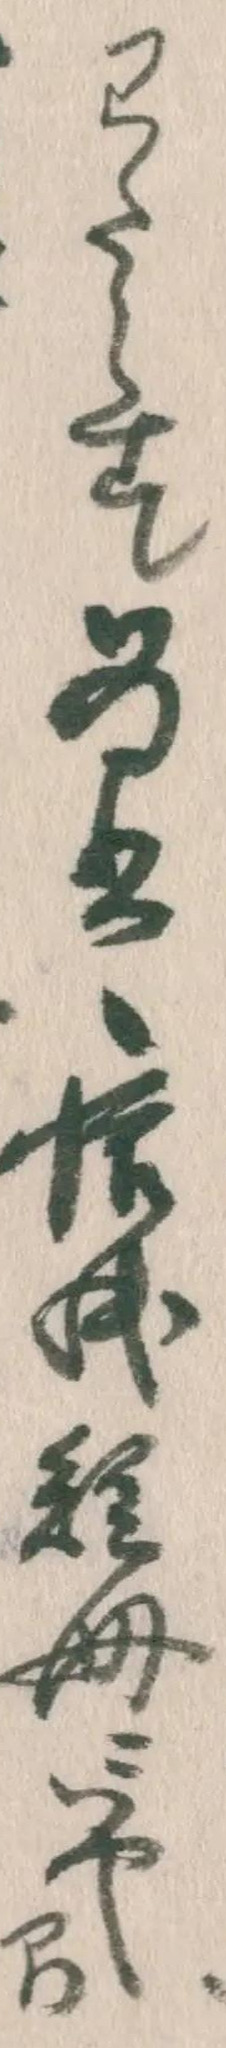わたらす為書候惰成短冊に御坐候間
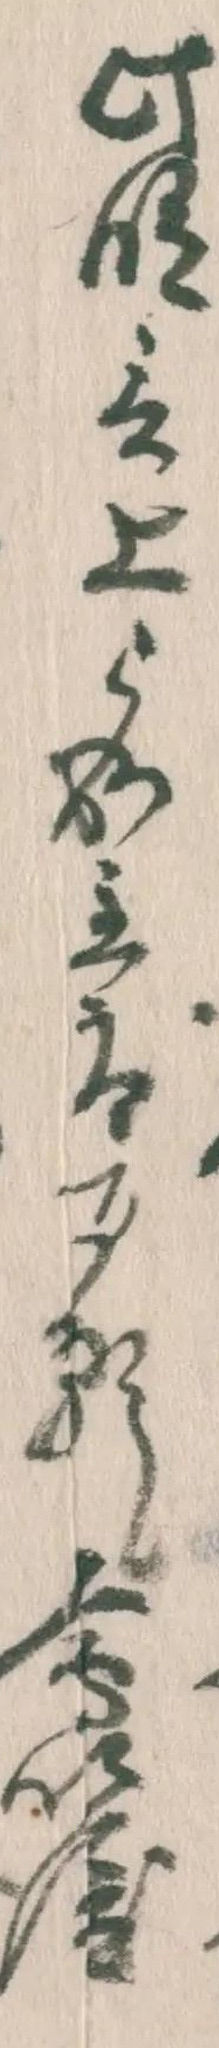此段言上被成置度奉願候会以後
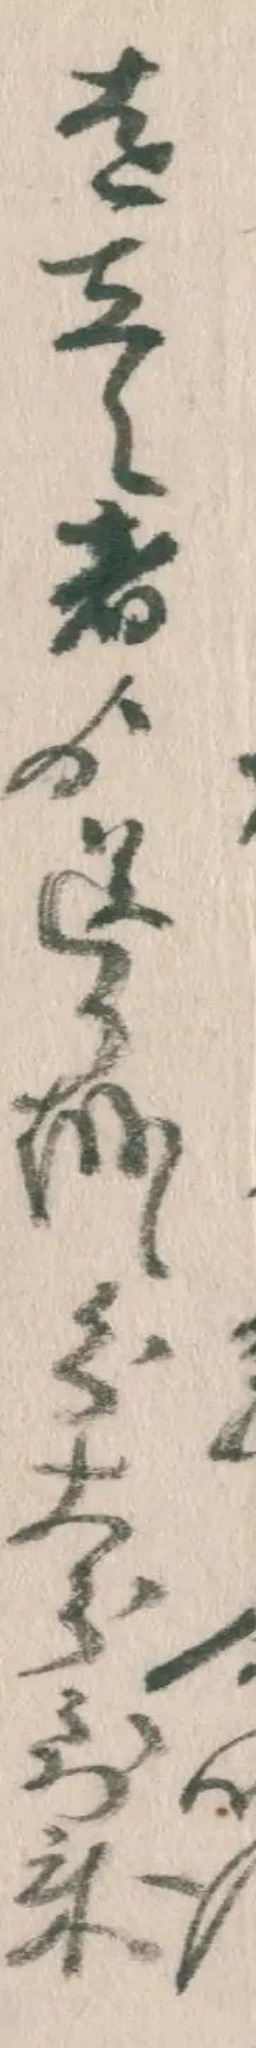遠立候者ゟ送り越候分大分到来
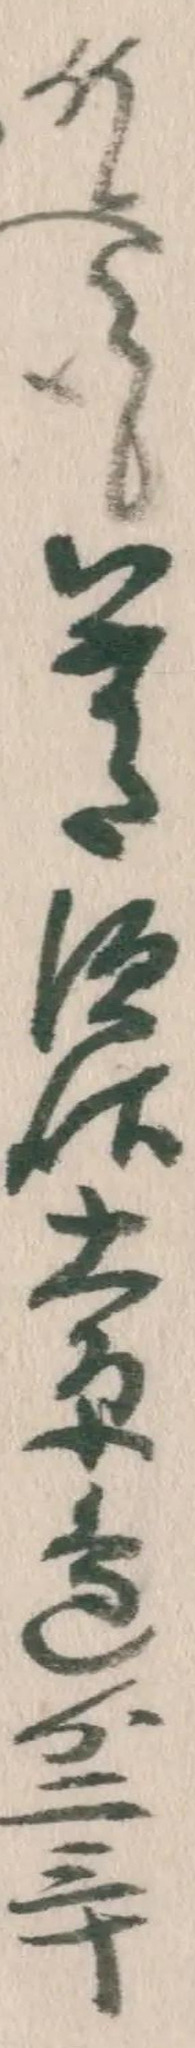仕候へともいまた嶋根大原辺ゟ二三十
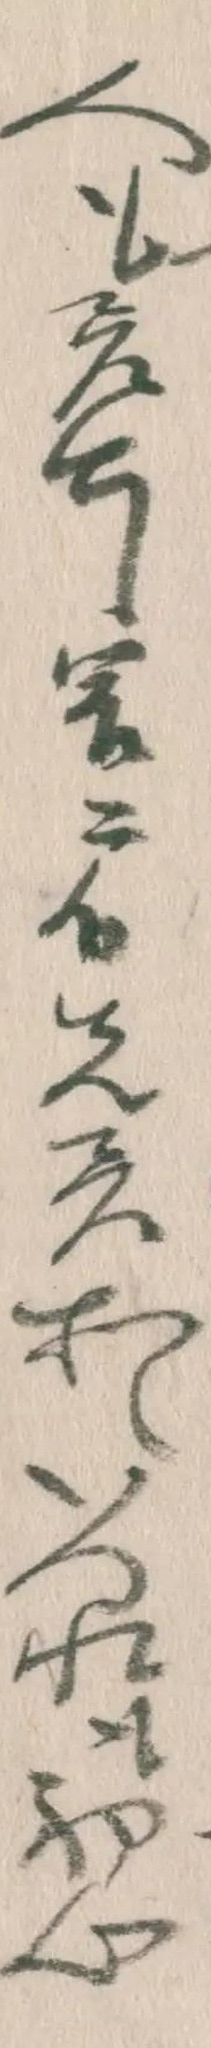人も差出候筈に付先差出候いつれも初心
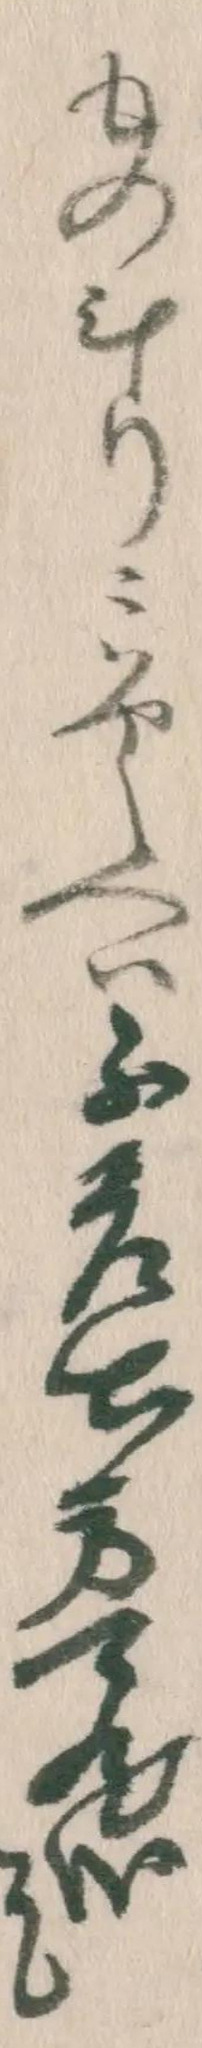もの斗りに御坐候へは不差出方可然哉とも
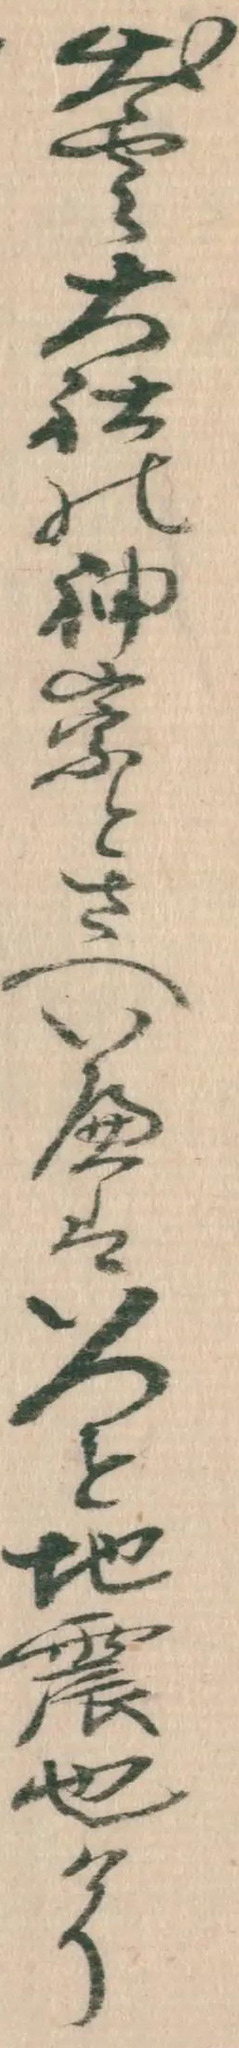出雲大社の神崇とさへいへはいつも地震也けり
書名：出雲紀行. 20
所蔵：国立国会図書館 National Diet Library, JAPAN
